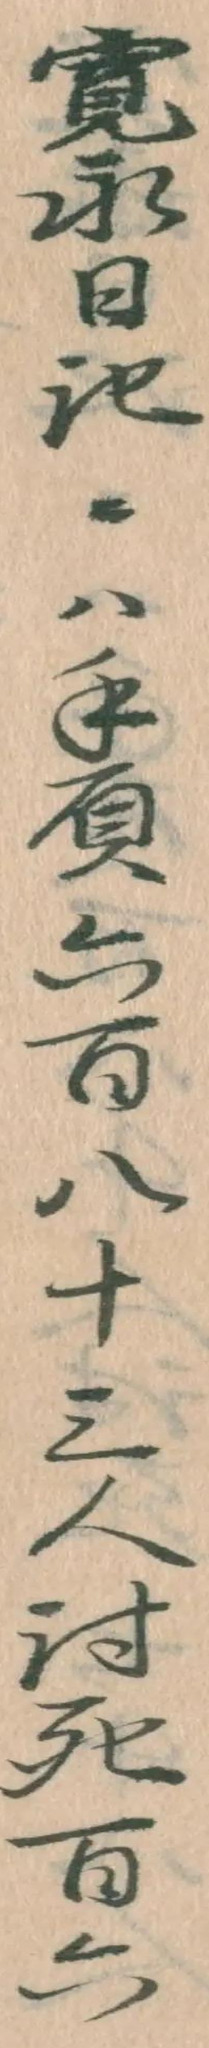寛永日記には手負六百八十三人討死百六
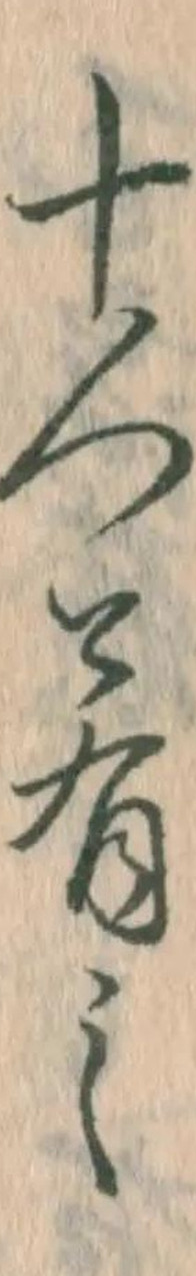十人と有之
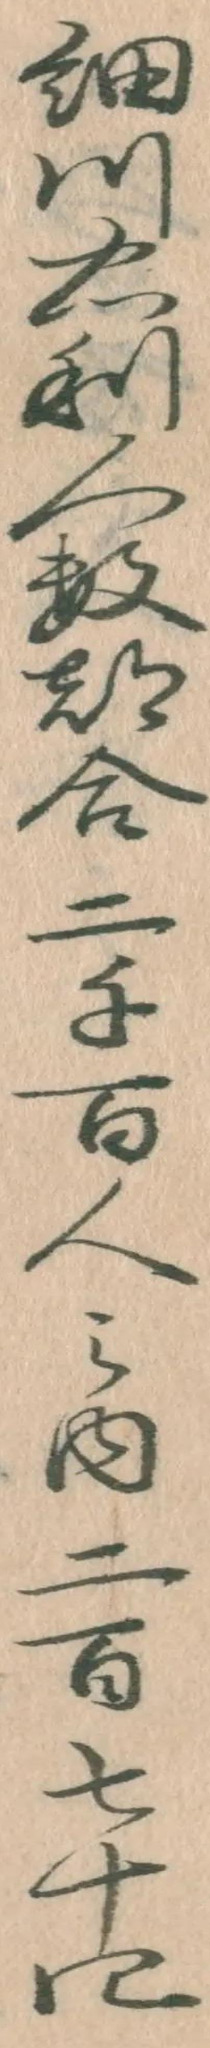細川忠利人数都合二千百人之内二百七十四
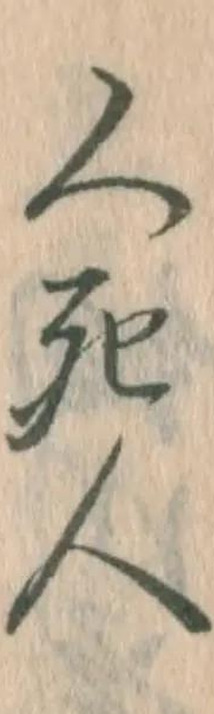人死人
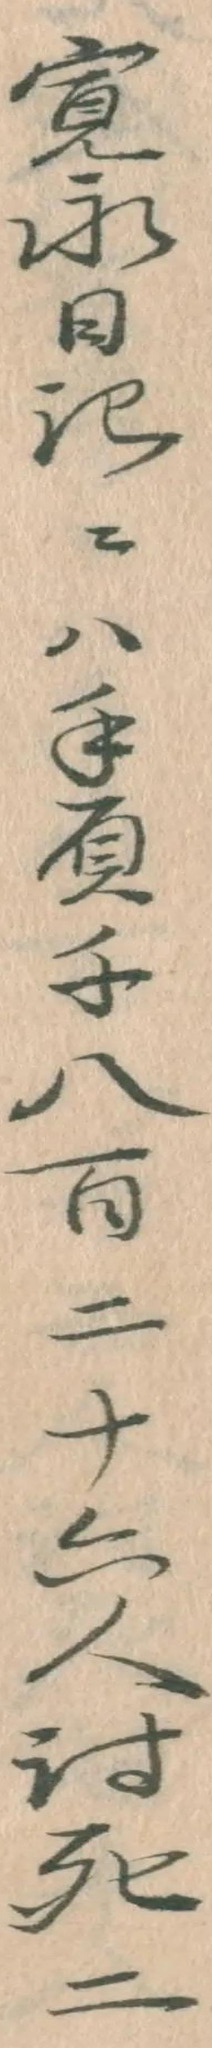寛永日記には手負千八百二十六人討死二
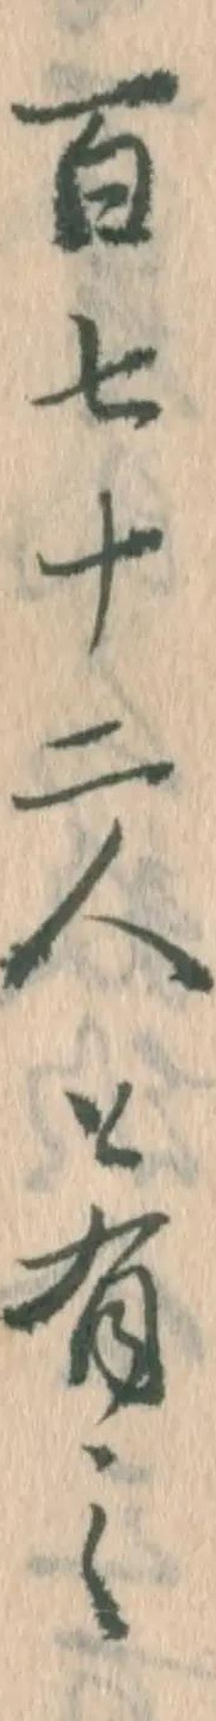百七十二人と有之
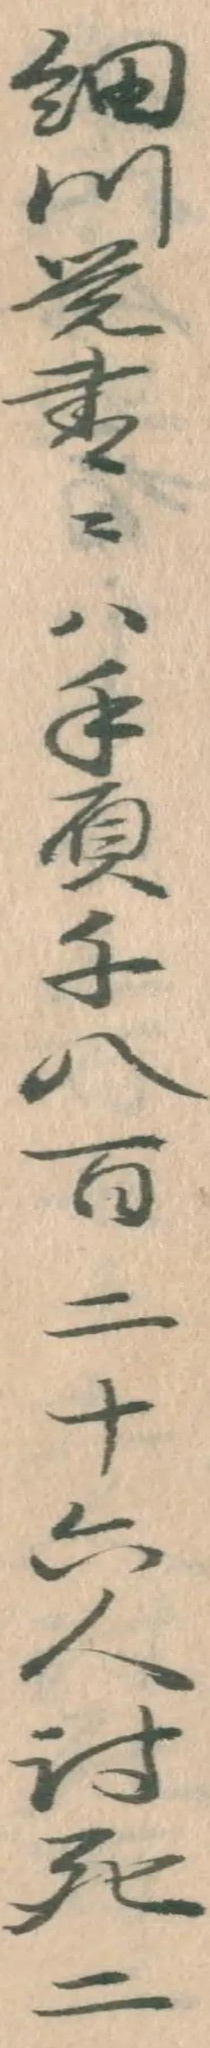細川覚書には手負千八百二十六人討死二
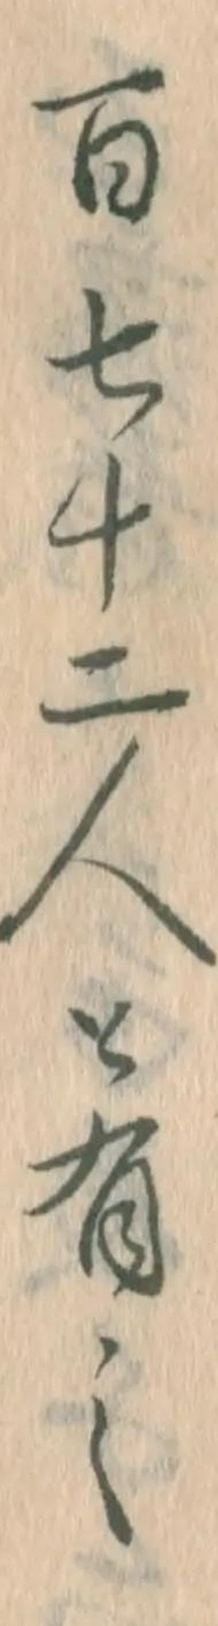百七十二人と有之

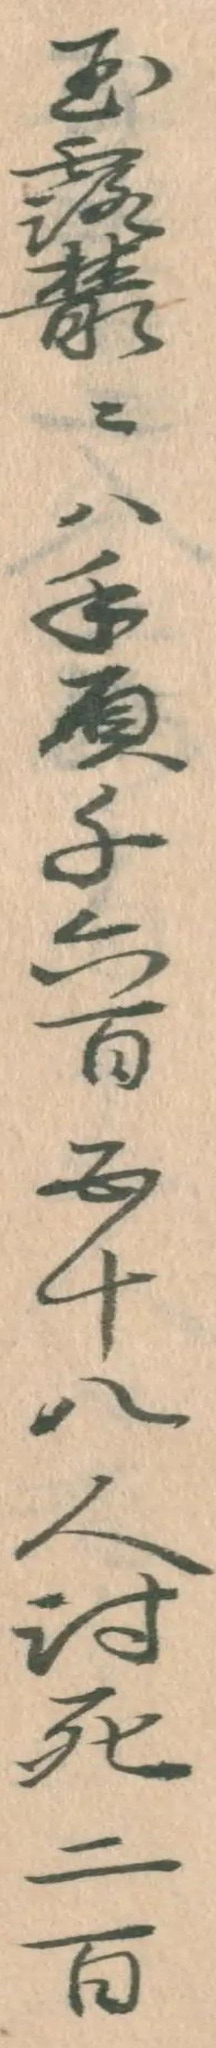玉露樷には手負千六百五十八人討死二百
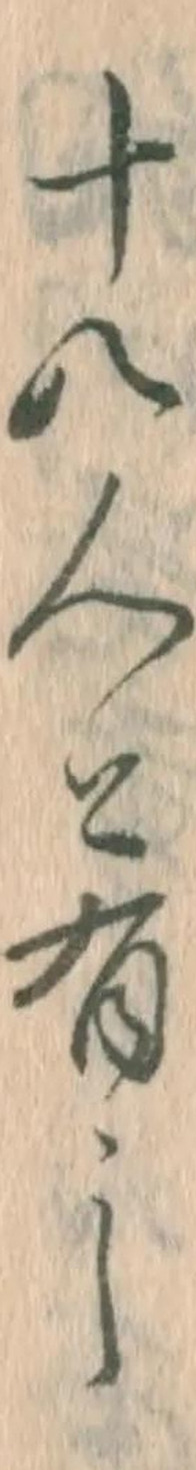十八人と有之
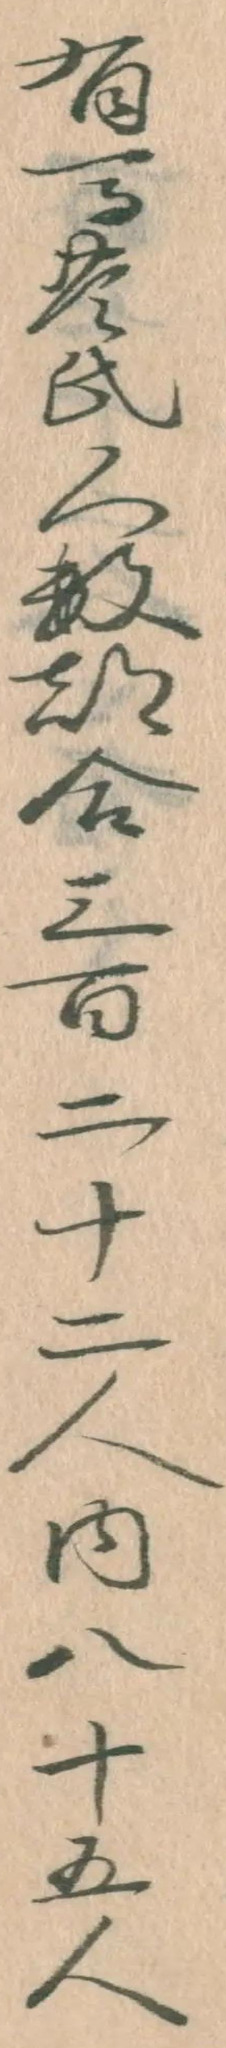有馬豊氏人数都合三百二十三人内八十五人
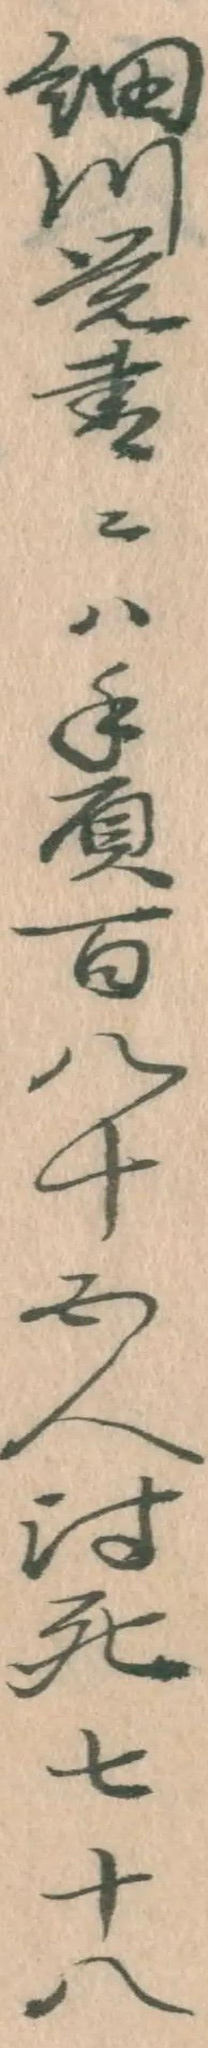細川覚書には手負百八十五人討死七十八
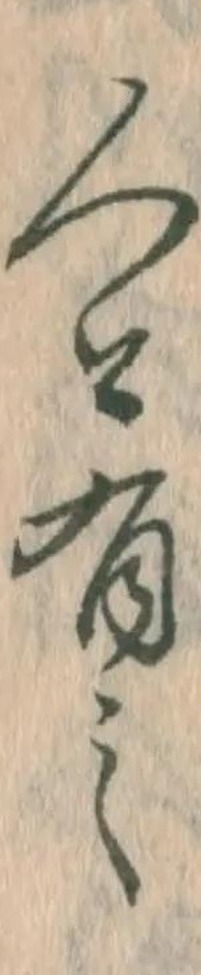人と有之
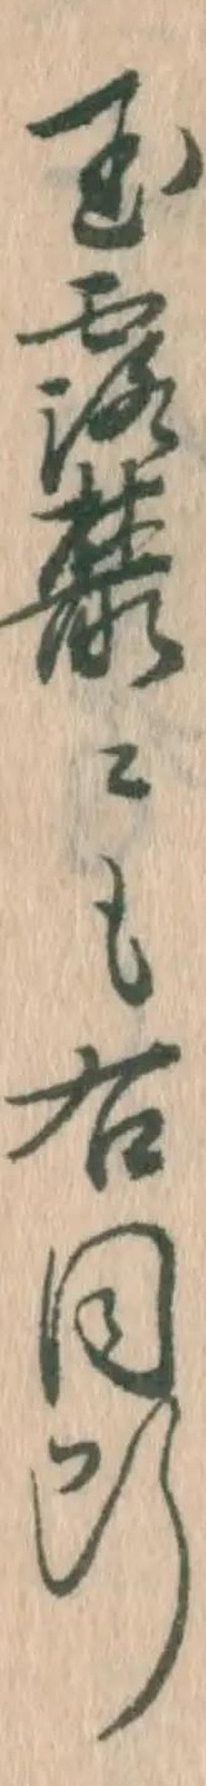玉露樷にも右同断
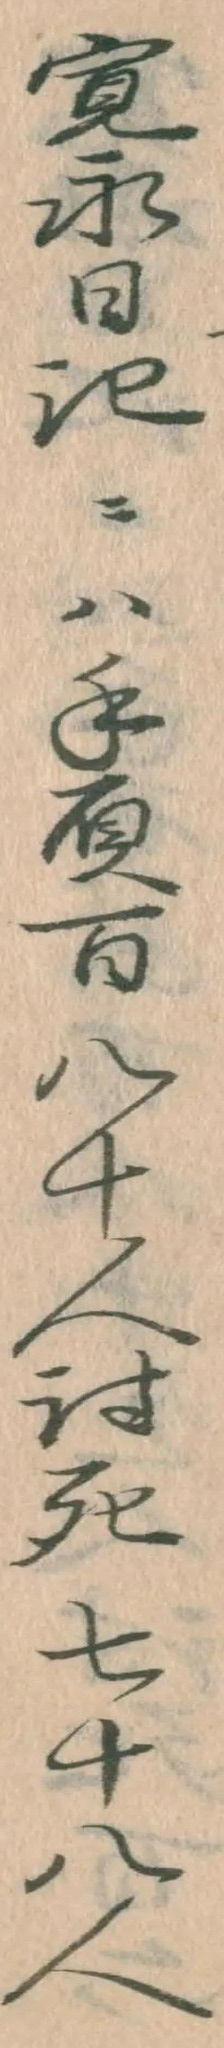寛永日記には手負百八十人討死七十八人
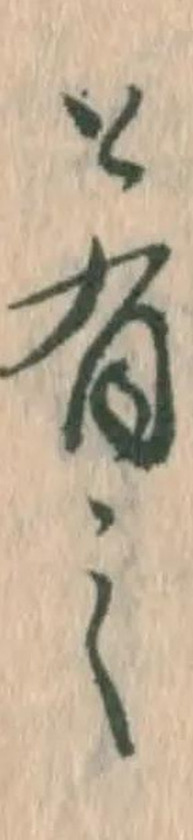と有之
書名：切支丹御退治記 49巻. [9]
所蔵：国立国会図書館 National Diet Library, JAPAN
